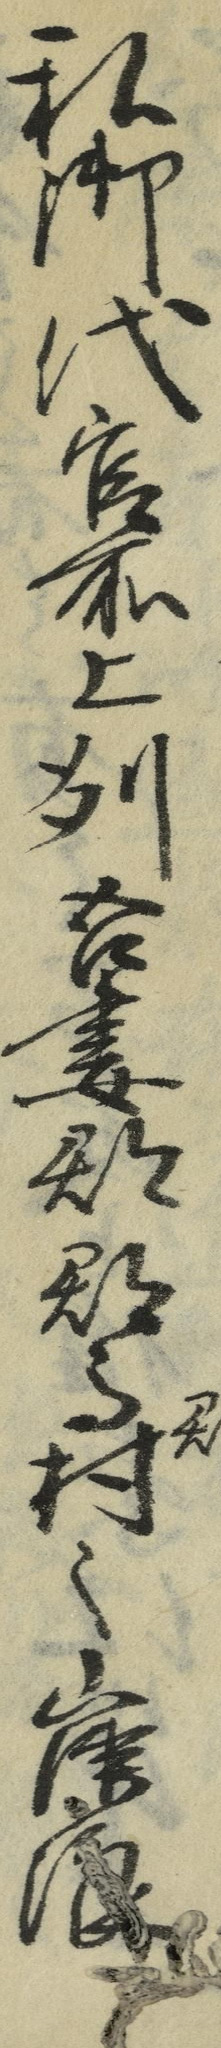私代官所上州吾妻郡郡馬郡村々山津浪
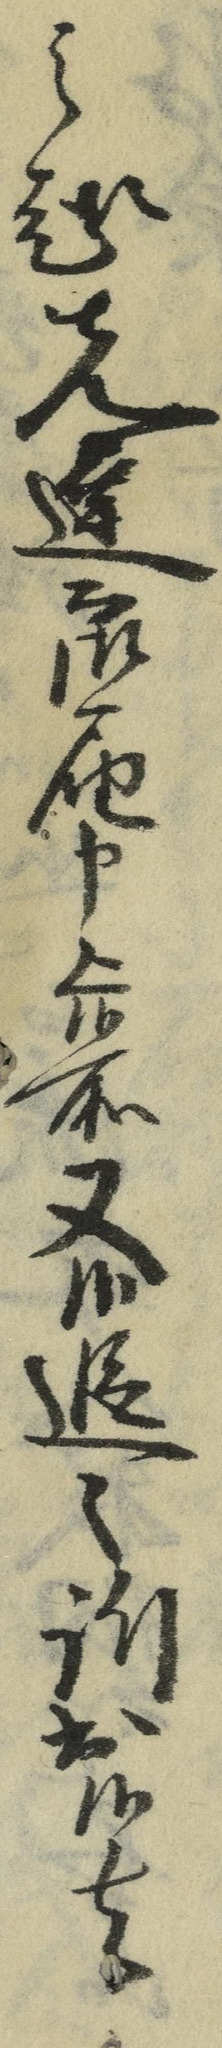之趣先達而御届申上候所又候追々訴出候は
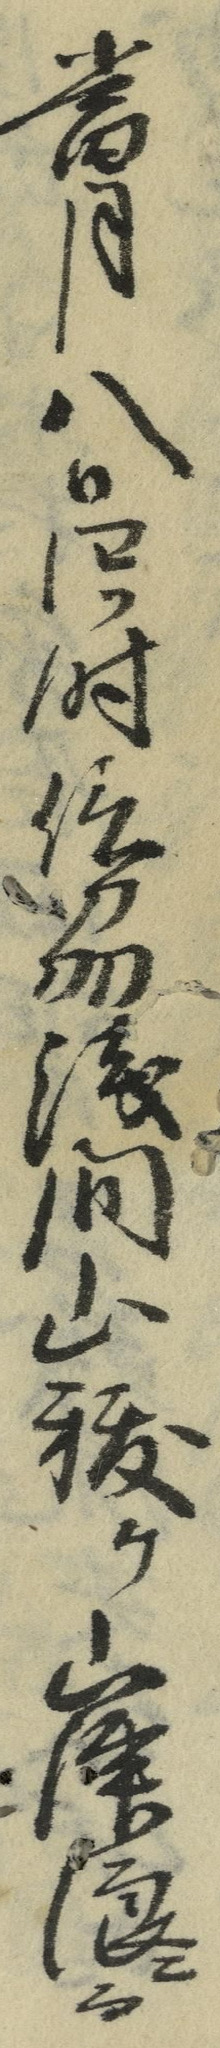当月八日四ツ時信州浅間山抜ケ山津浪に而
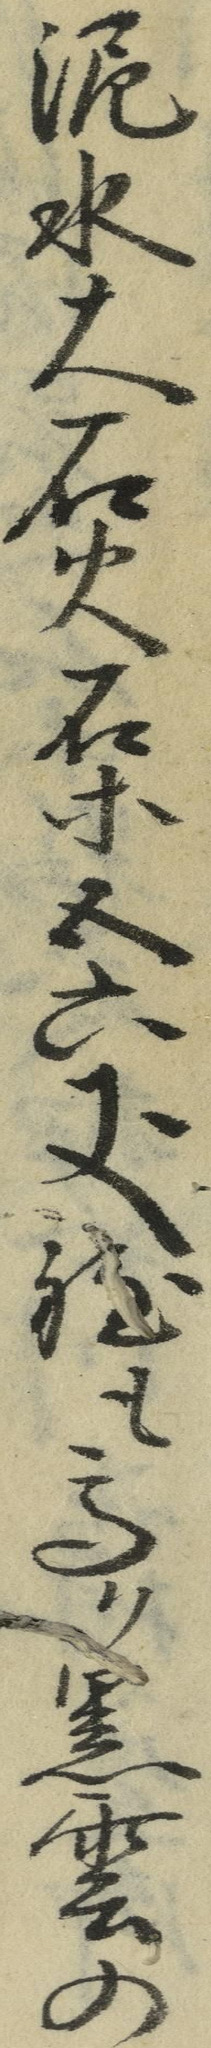泥水大石火石等五六丈程も高ク黒雲の
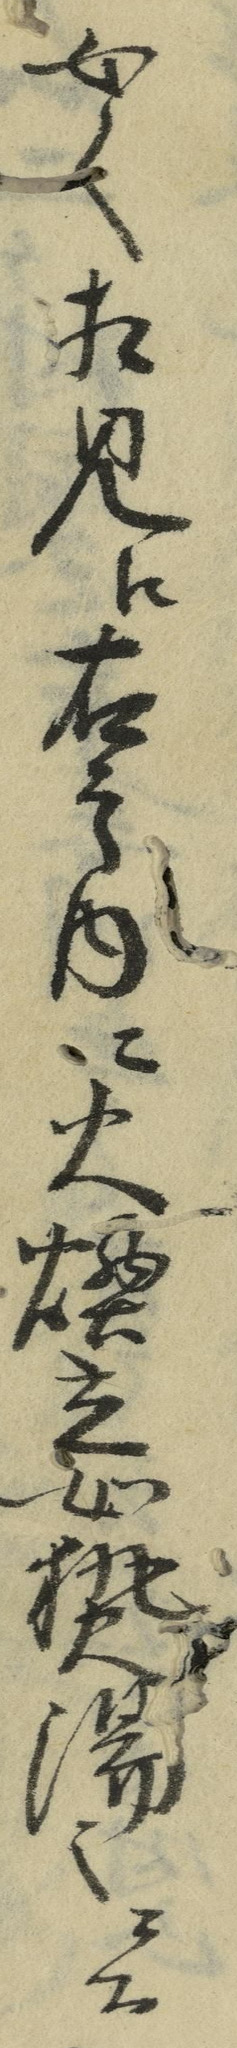如く相見え右之内に火煙立如熱湯之に而
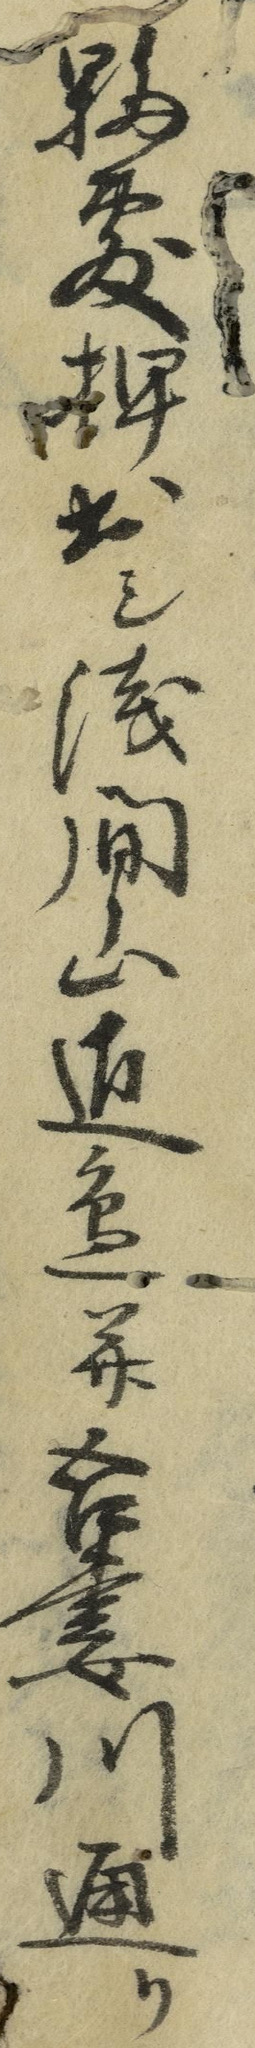夥敷押出シ浅間山近辺并吾妻川通り
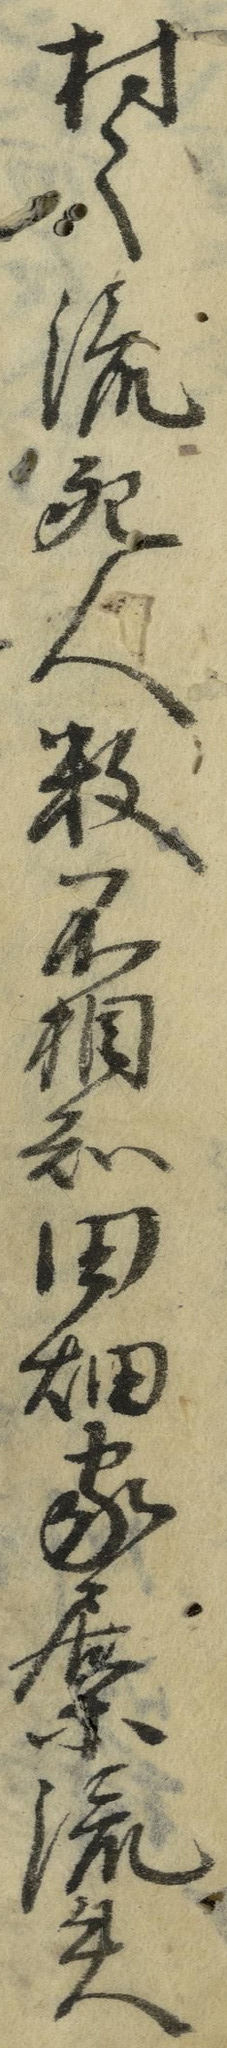村々流死人数不相知田畑家居等流失
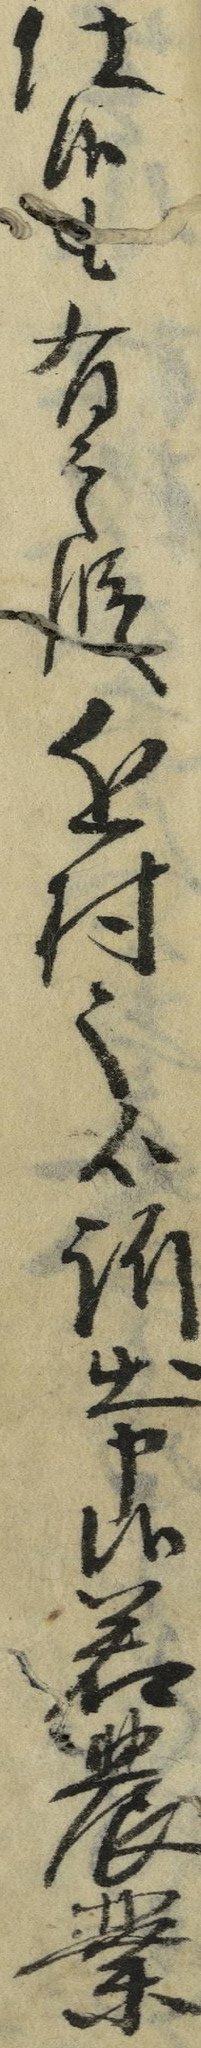仕候も有之段近村々ゟ訴出申候若農業
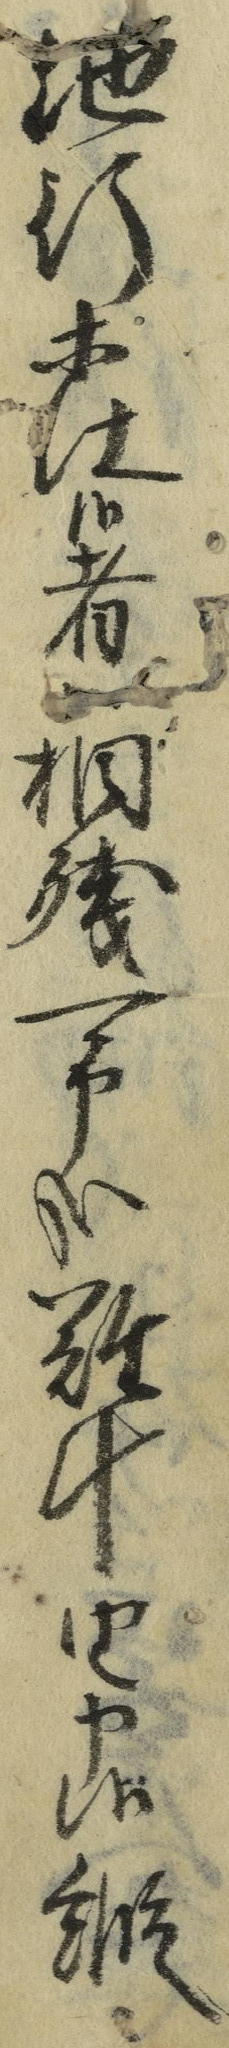施行等仕候者相残可申哉難計由申候縦
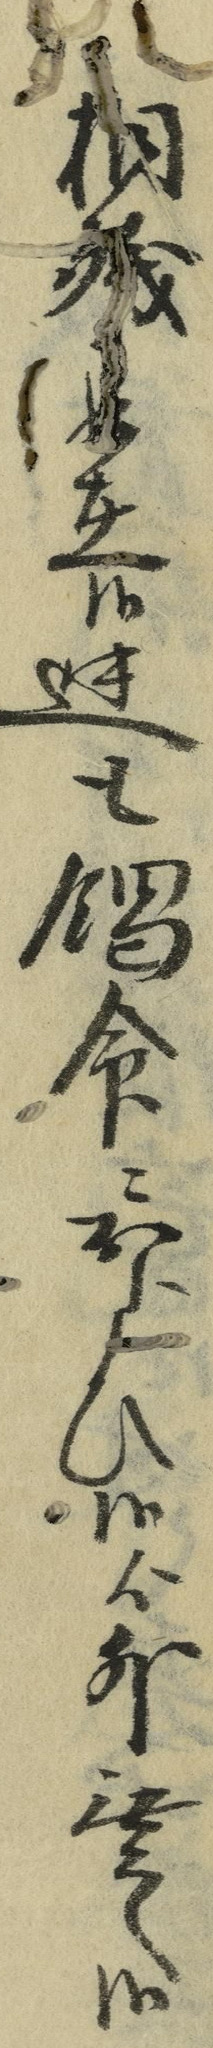相残罷在候迚も謁命におよひ候ゟ外無之候
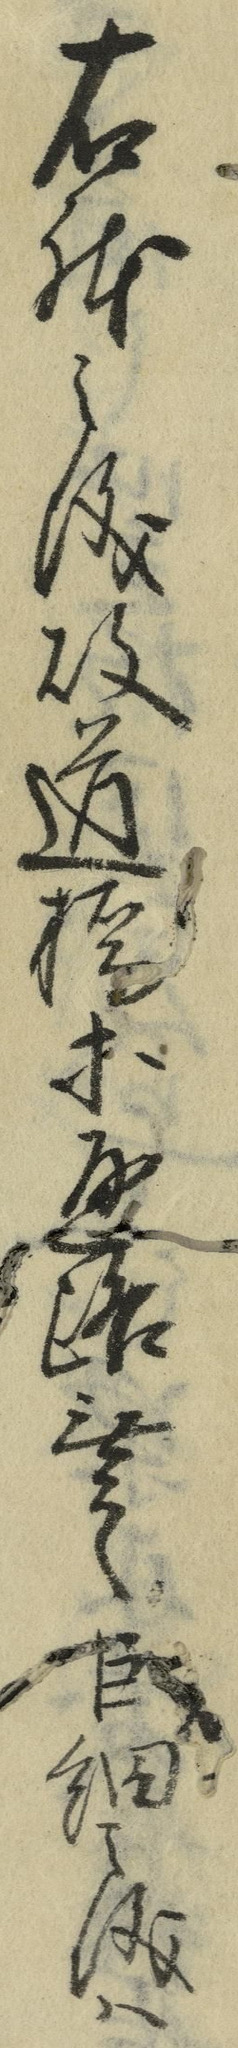右躰之儀故道橋等通路無之巨細之儀は
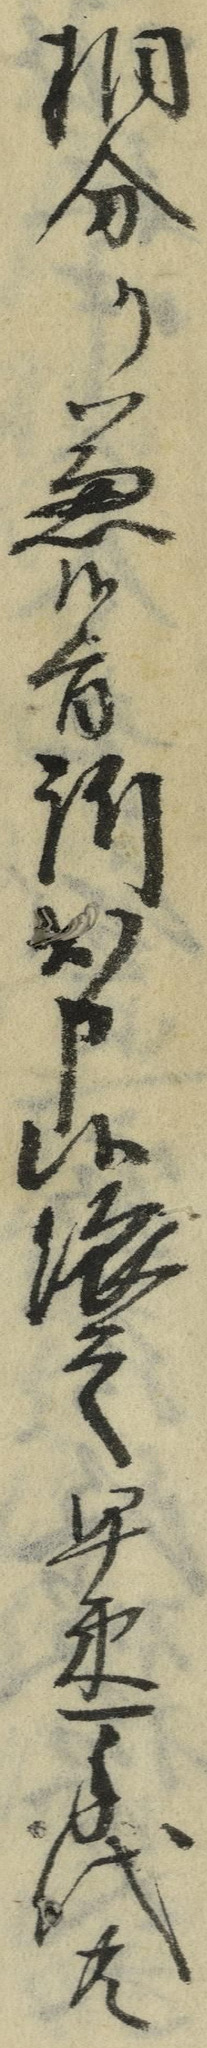相分り兼候旨訴出申候依之早速手代共
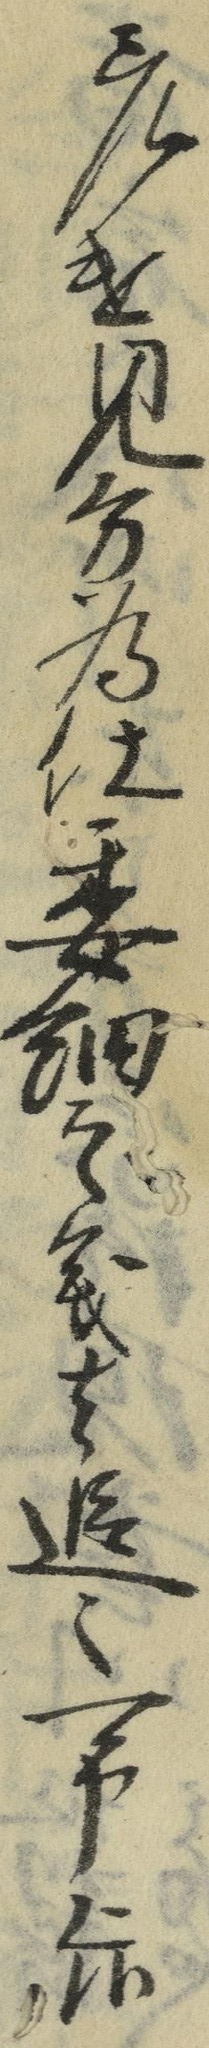差遣見分為仕委細之義は追々可申上候
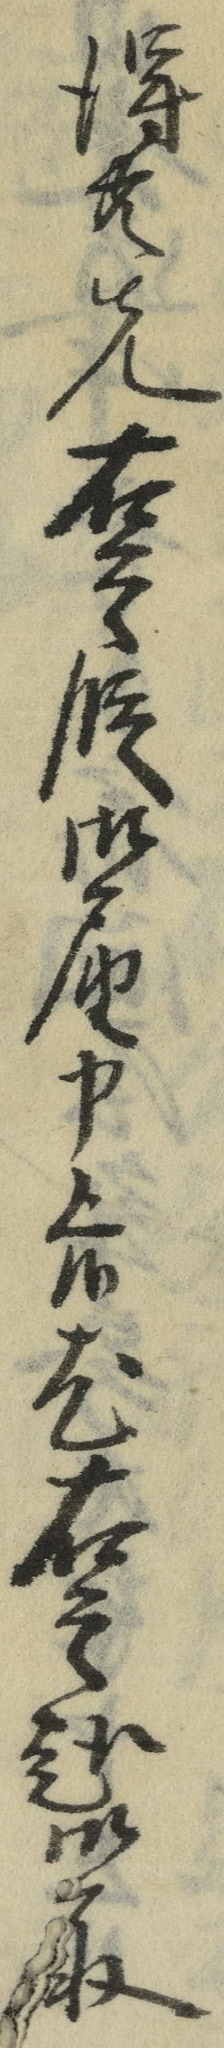得共先右之段御届申上候尤右之趣御取
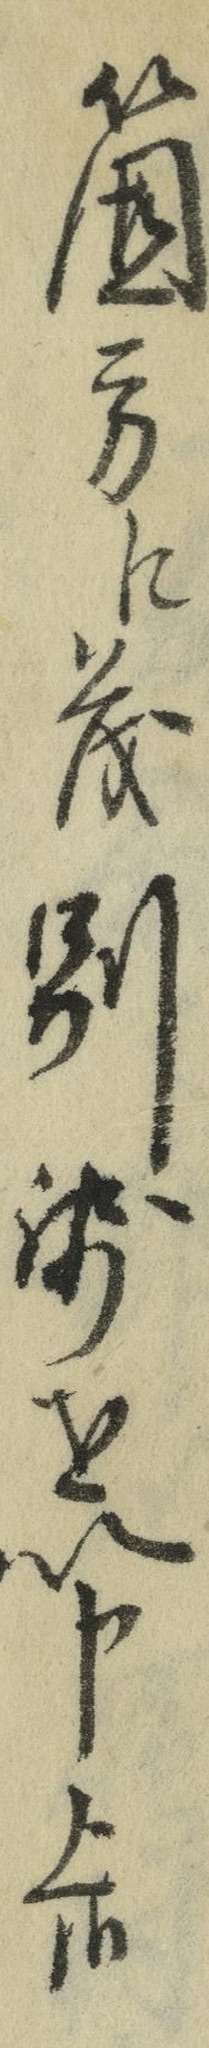箇方江も別紙を以申上候
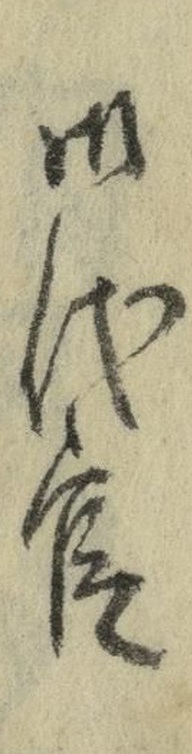御代官
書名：天明三卯年七月　浅間山焼注進写
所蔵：東京大学地震研究所図書室 Earthquake Research Institute Library, The University of Tokyo, JAPAN
